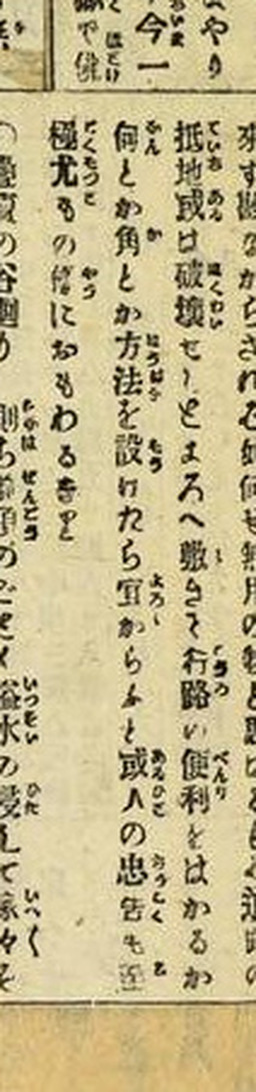何とか角とか方法を設けたら宜からふと或人の忠告も至
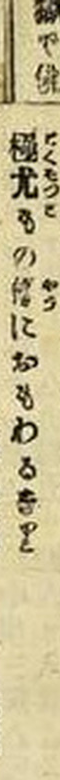極尤もの様におもわるなり
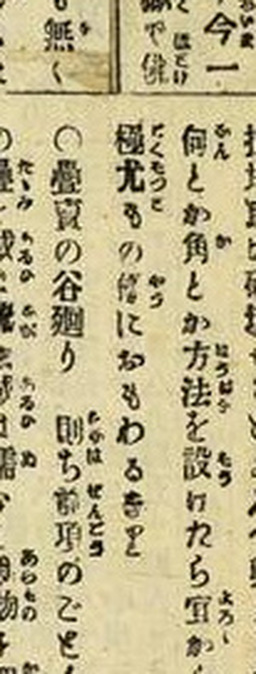極尤もの様におもわるなり
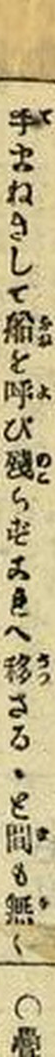手まねきして船を呼び殘らずこれへ移さるゝと間も無く
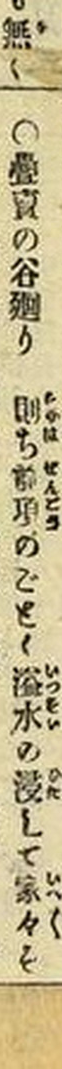○疊賣の谷廻り則ち前項のごとく溢水の浸して家々そ
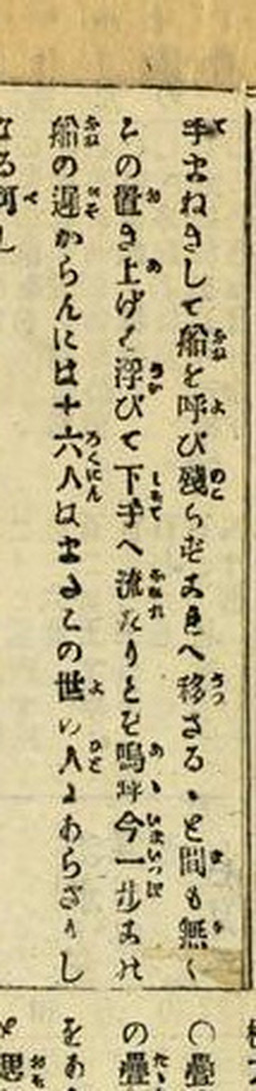その置き上げは浮びて下手へ流たりとぞ嗚呼今一歩この
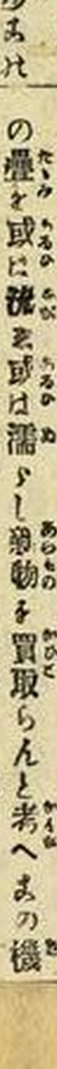の疊を或は流し或は濡らし新物を買取らんと考へこの機
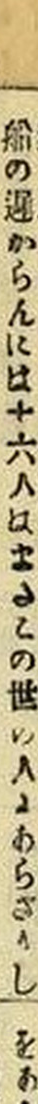船の遲からんには十六人はまたこの世の人にあらざりし
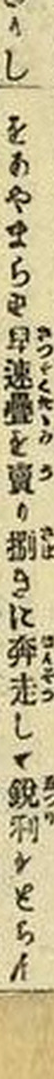をあやまらす早速疊を賣り捌きに奔走して鋭利をとらん
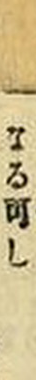なる可し
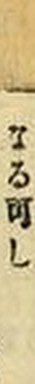なる可し
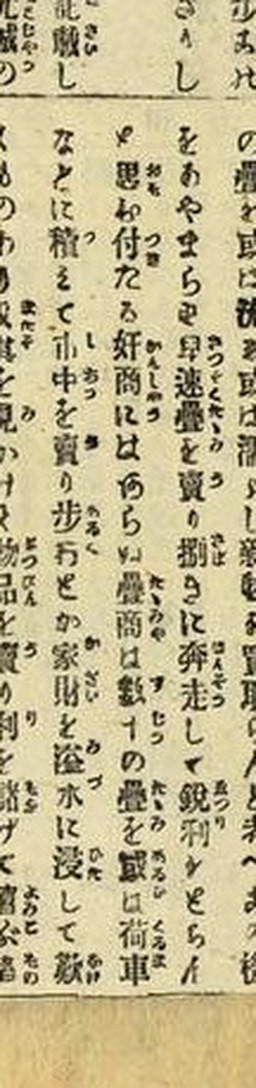と思ひ付たる奸商にはあらぬ疊商は數十の疊を或は荷車
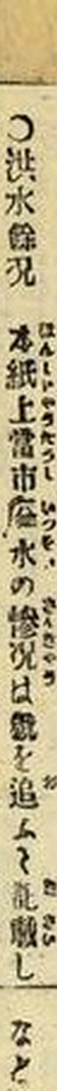○洪水餘况本紙上當市溢水の惨况は號を追ふて記載し
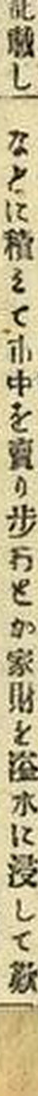なとに積みて市中を賣り歩行とか家財を溢水に浸して歎
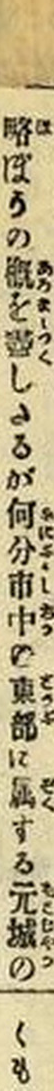略ぼかの概を盡したるが何分市中の東部に属する元城の
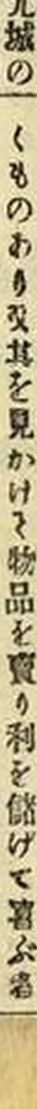くものあり又其を見かけて物品を賣り利を儲けて喜ぶ者
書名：温古集 五巻
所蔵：福井県文書館 Fukui Prefectural Archives
